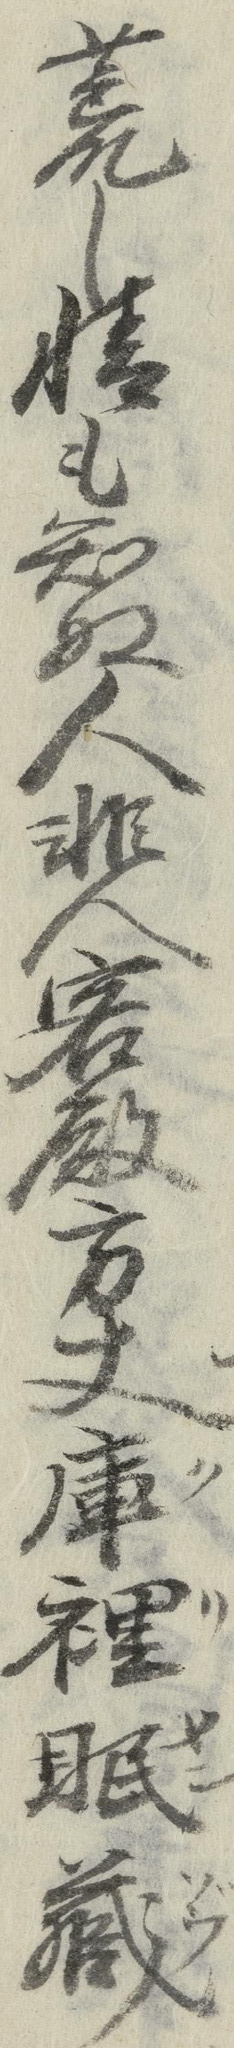荒し情も知ぬ人非人客殿方丈庫裡眠蔵
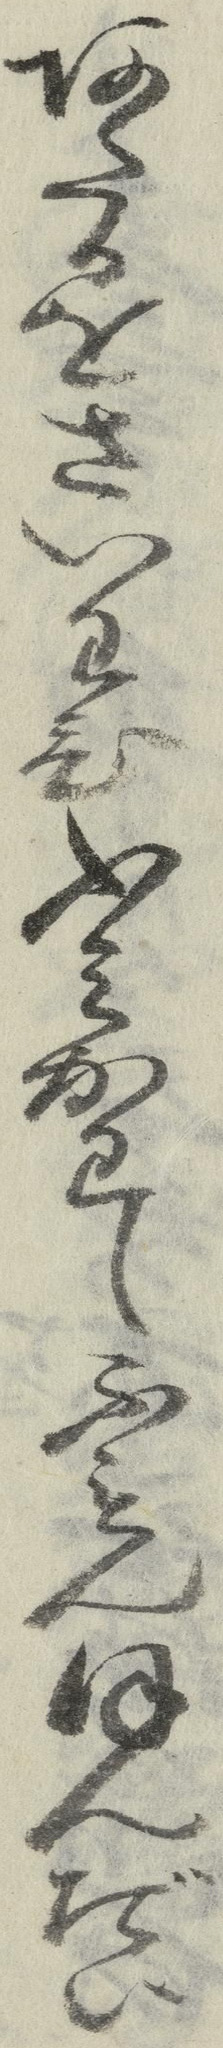あたるをさいわひふみかわしふもんほんだい
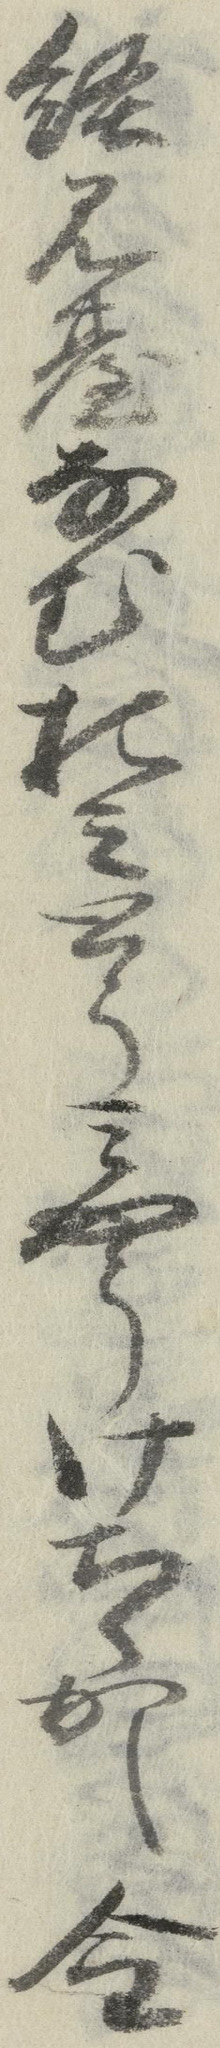経見台なむたみとうみやうけちらかし金

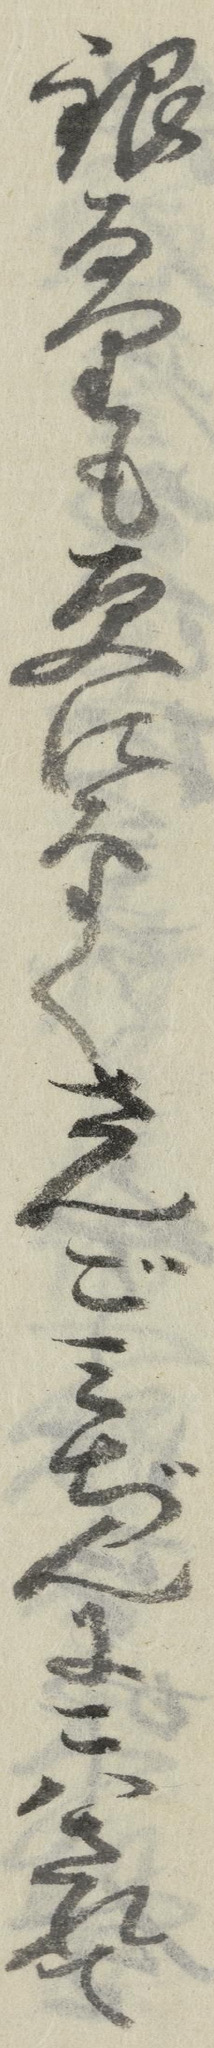銀るりも更になくさんごみぢんにこはされて
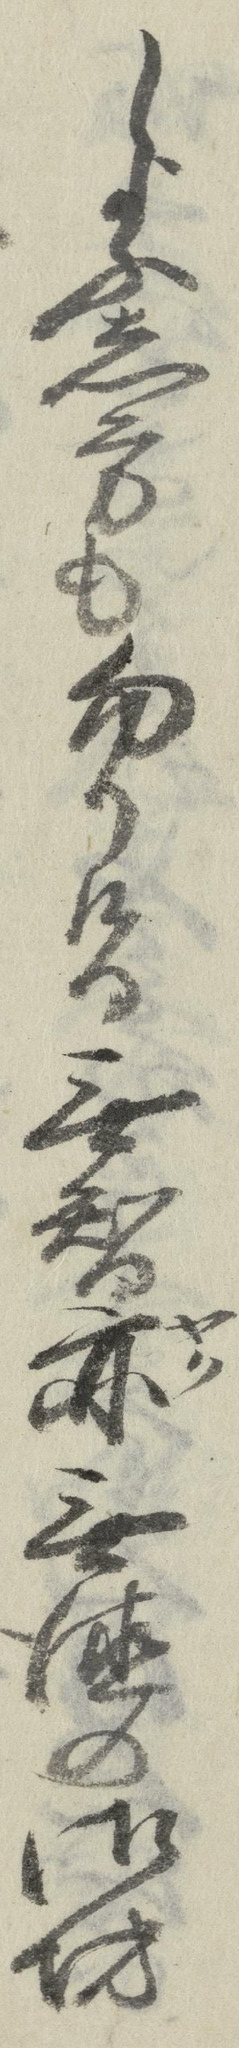しよふし方も勿りける無智亦無徳の御坊
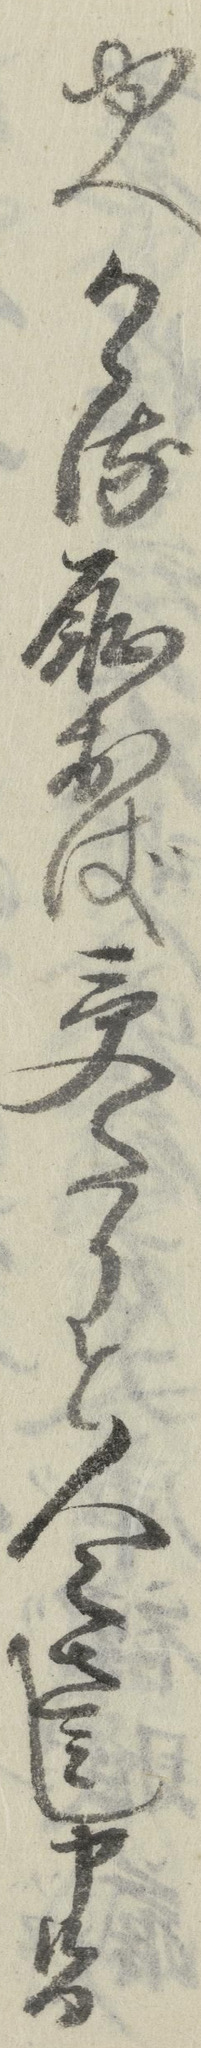ゆへかゝる恥おば受たりと人々さみし申ける
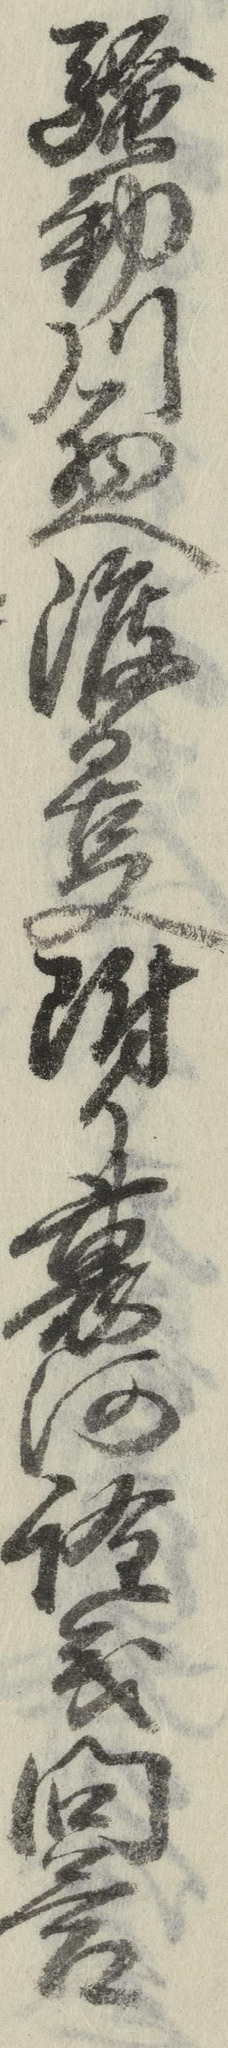騒動川西へ渡る事附り裏河詮義問答
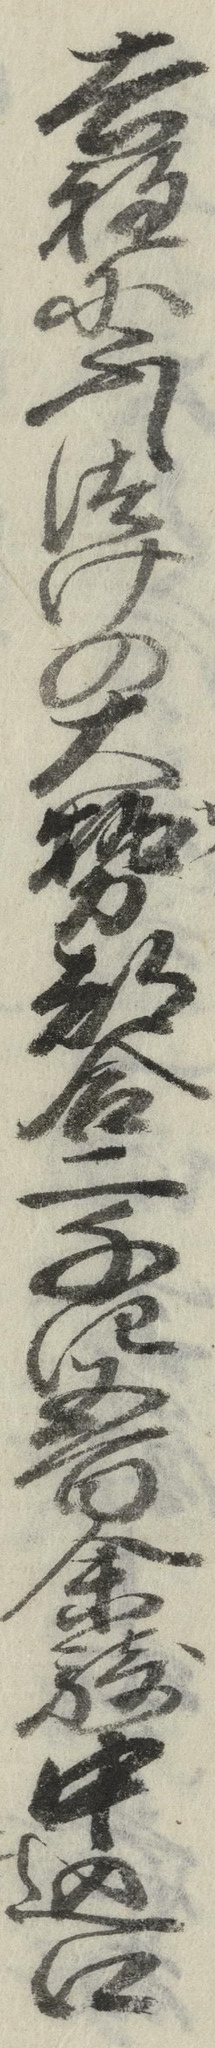去程にふしつけの大勢都合二千四五百余騎中込口
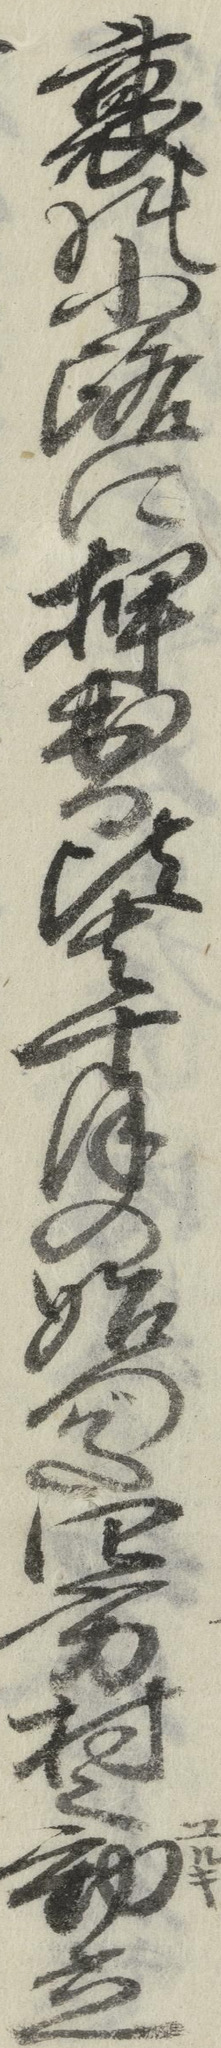裏の小路に押出る頃は十月の始つがた四方村々動立
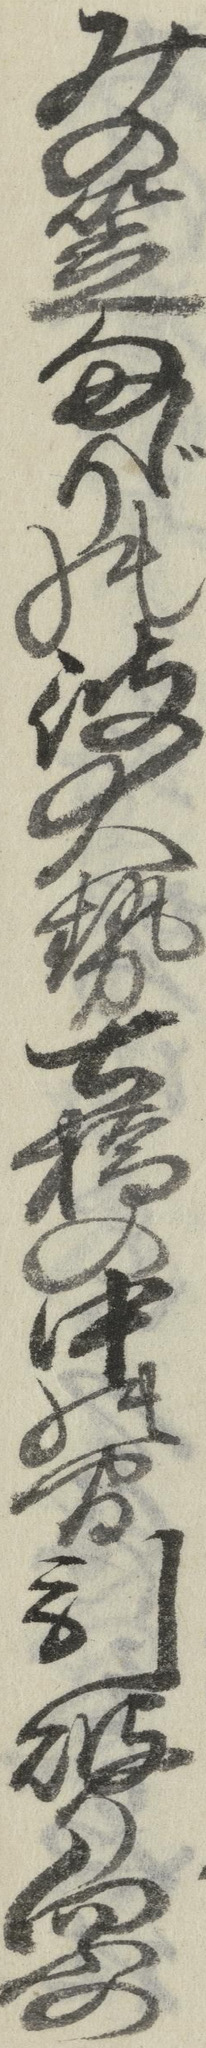みの笠まじりの彼大勢土橋の中の間引破り向ふの
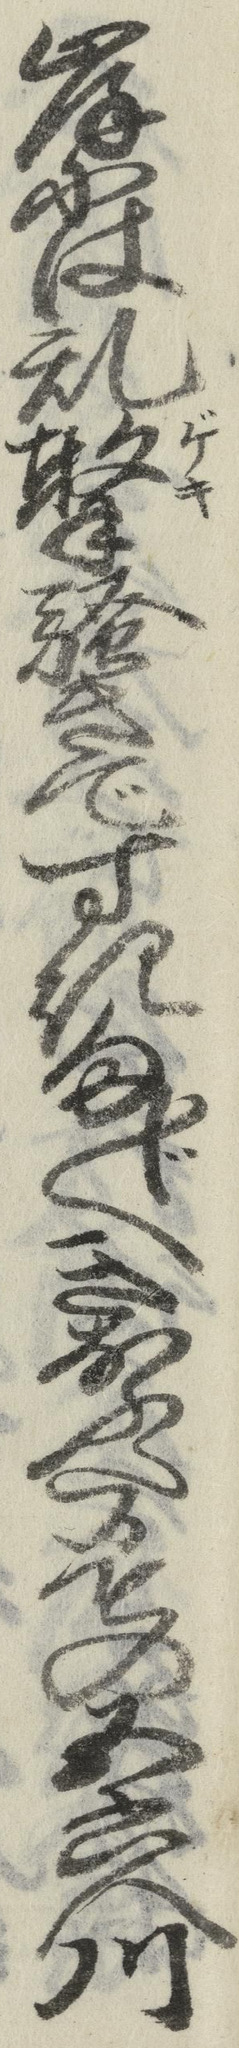岸には乱撃騒きですきまじくきなふたるもの五六人川
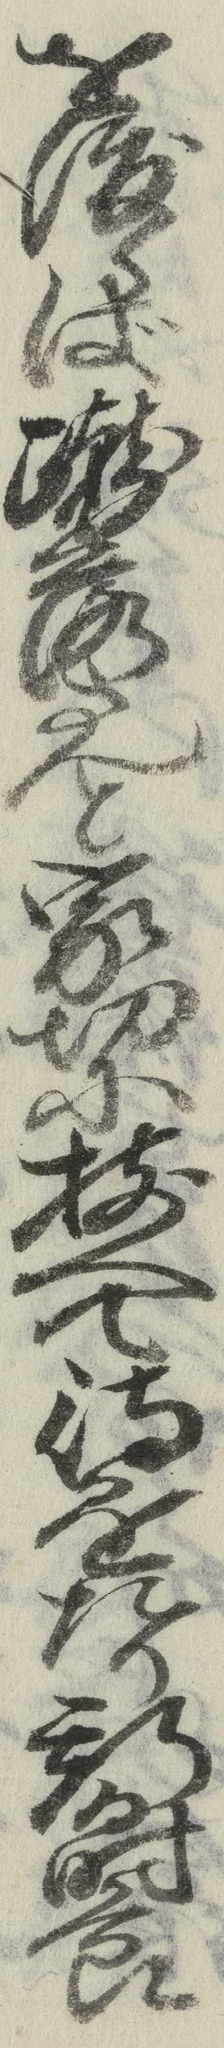を渡らば蹴落さんと家切に技へて待懸たり斯る時節
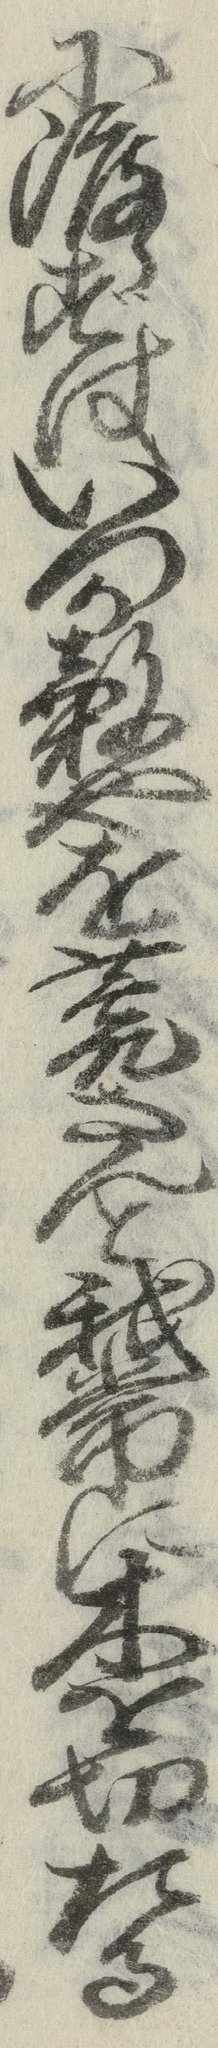に渡らずはいつか穀やを荒さんと我常に木を切たる
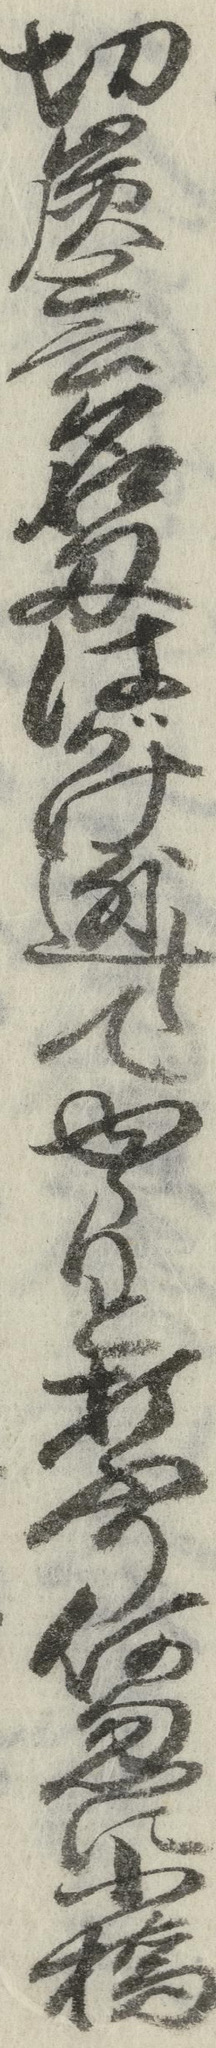切炭と云名刃はがけ迯してゆらりと打ふり何忽に小橋
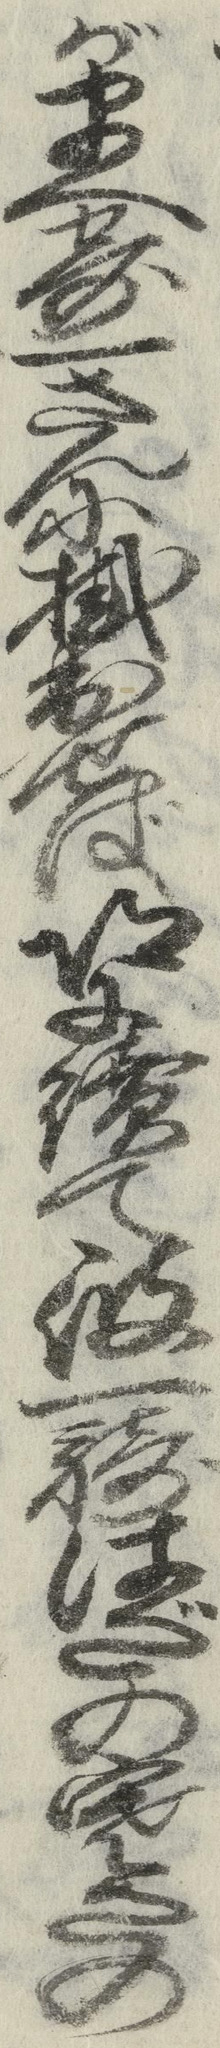が半へ寄一さんに掛出せば跡に続て彼一騎はだの寒さの
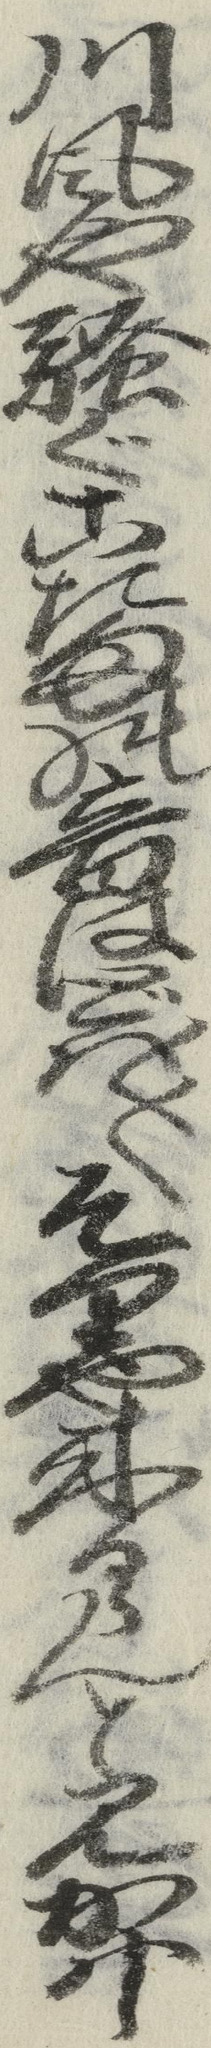川風や騒ぐこたまの音はどは〳〵〳〵そりや来るらんと見かけ
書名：浅間大焼騒動記　中
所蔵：東京大学地震研究所図書室 Earthquake Research Institute Library, The University of Tokyo, JAPAN
